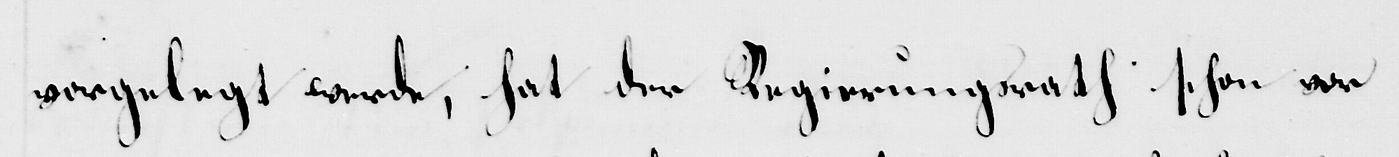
vorgelegt werde, hat der Regierungsrath schon vor
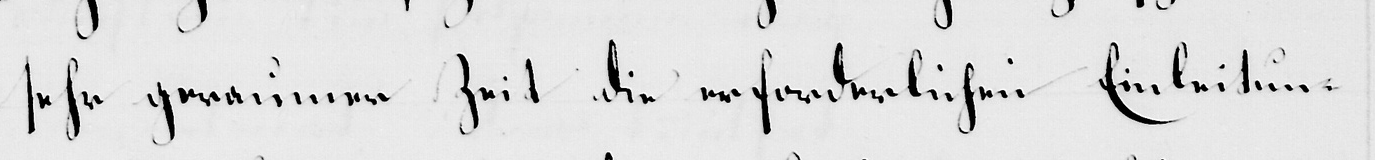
sehr geraumer Zeit die erforderlichen Einleitun¬
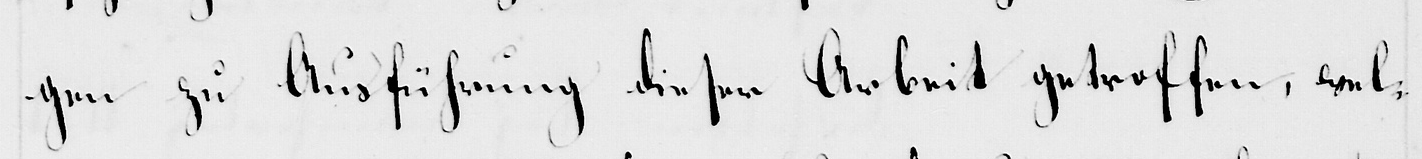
gen zu Ausführung dieser Arbeit getroffen, wel¬
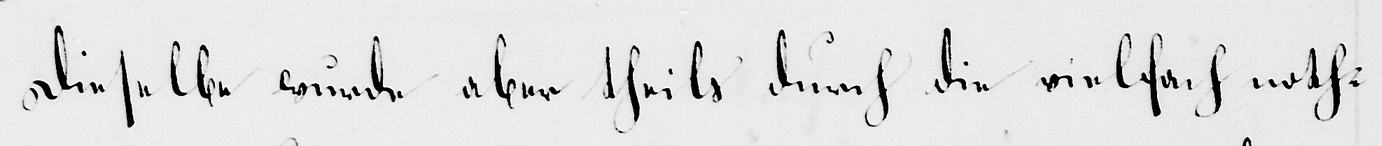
Dieselbe wurde aber theils durch die vielfach noth¬
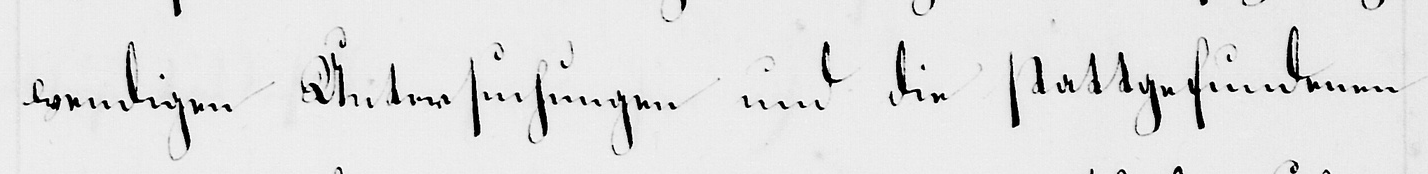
wendigen Untersuchungen und die stattgefundenen
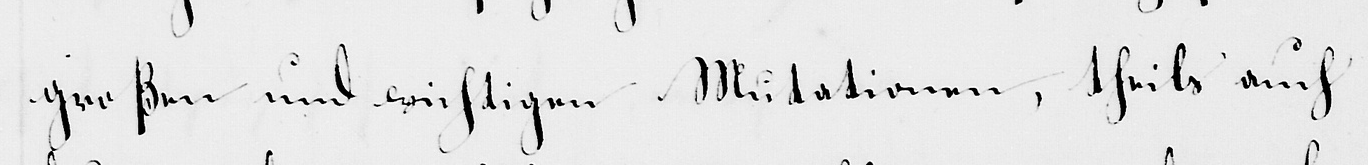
großen und wichtigen Mutationen, theils auch
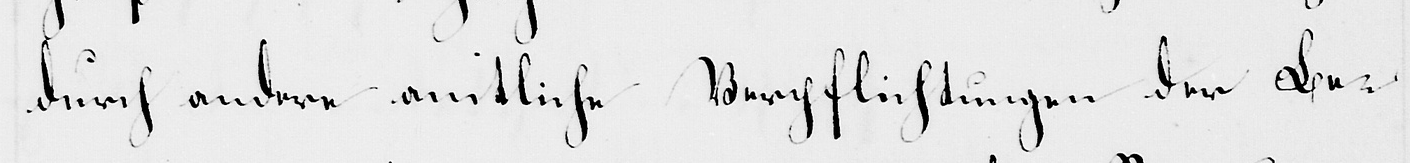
durch andere amtliche Verpflichtungen der Be¬
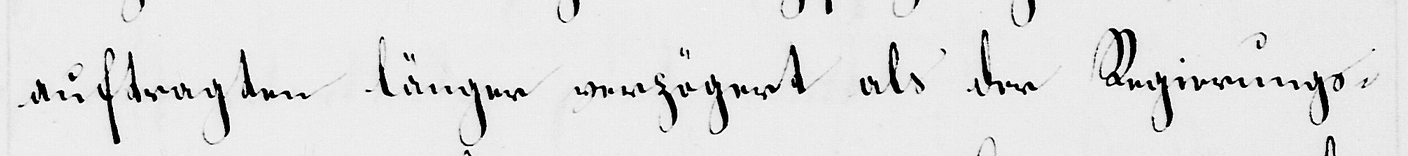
auftragten länger verzögert als der Regierungs¬
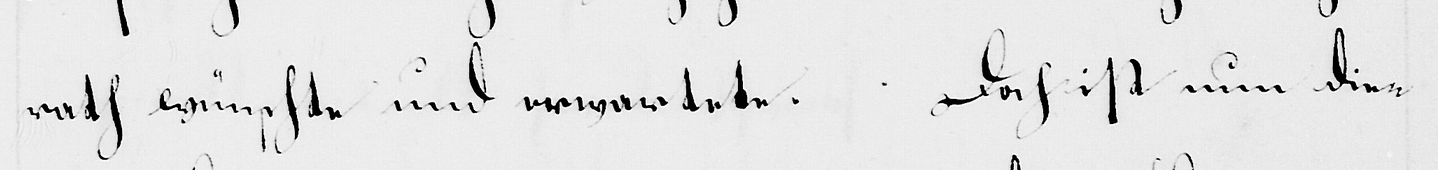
rath wünschte und erwartete. Doch ist nun die¬
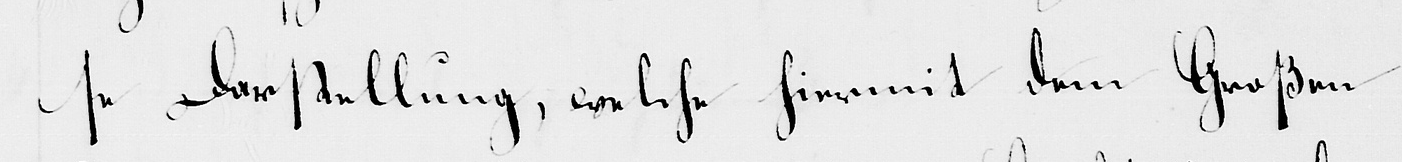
se Darstellung, welche hiermit dem Großen
